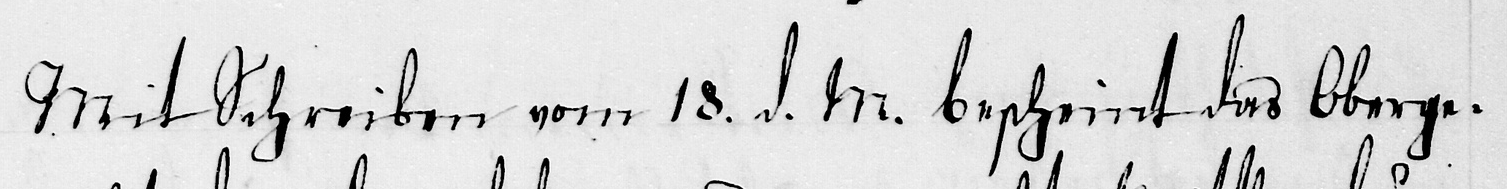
Mit Schreiben vom 18. d. M. bescheint das Oberge¬
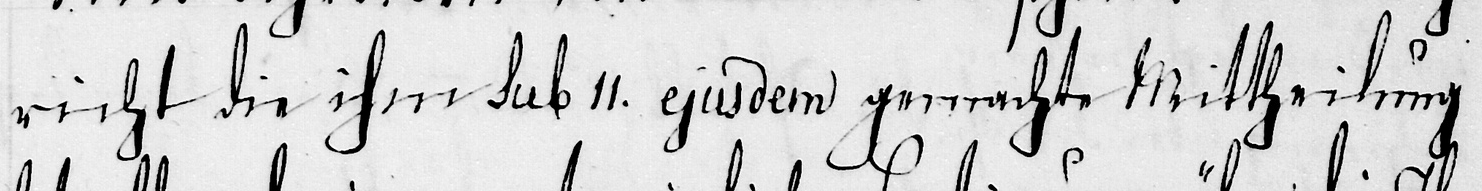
richt die ihm sub. 11. ejusdem gemachte Mittheilung
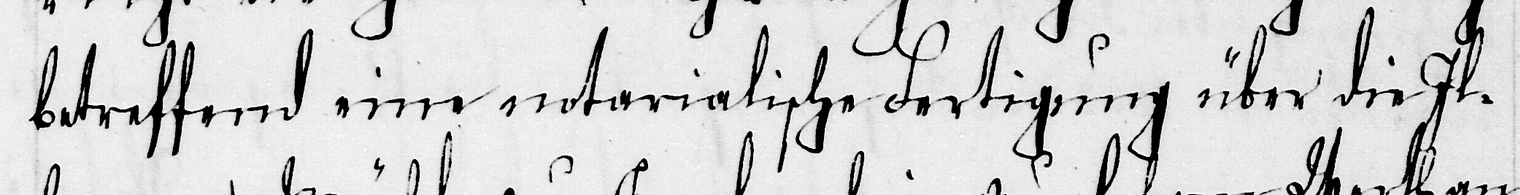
betreffend eine notarialische Fertigung über die Il¬
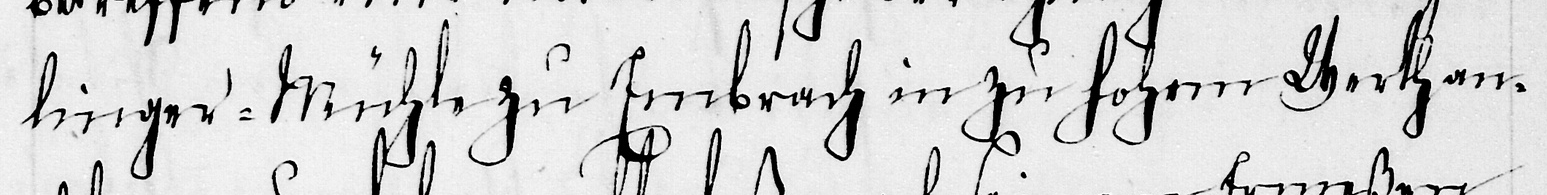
linger-Mühle zu Embrach in zu hohem Werth ans¬
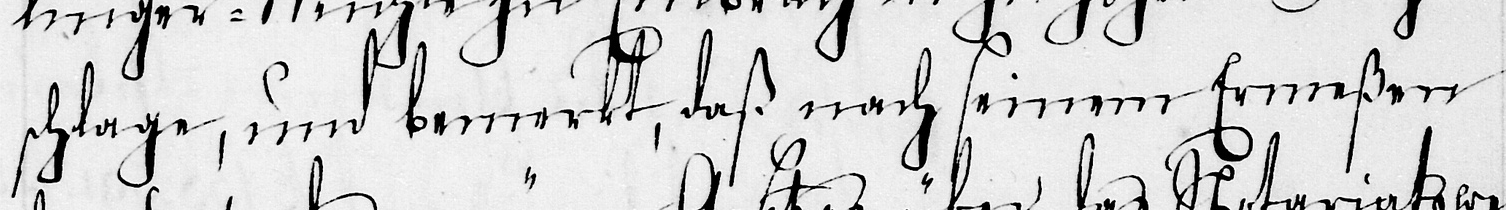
chlage, und bemerkt, daß nach seinem Ermeßen
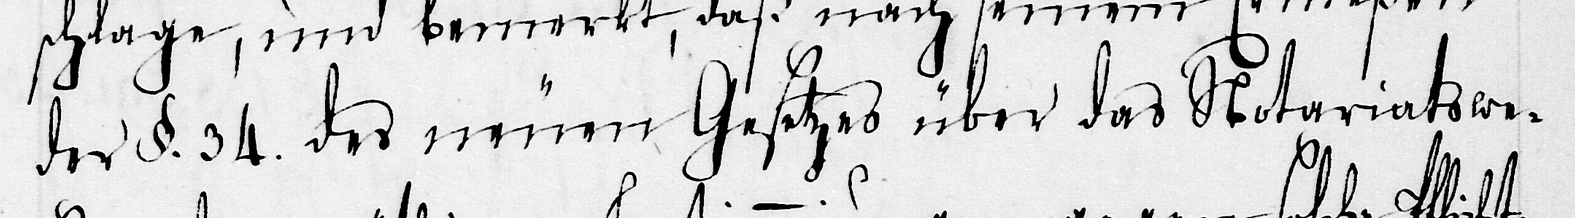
der §. 34. des neuen Gesetzes über das Notariatswe¬
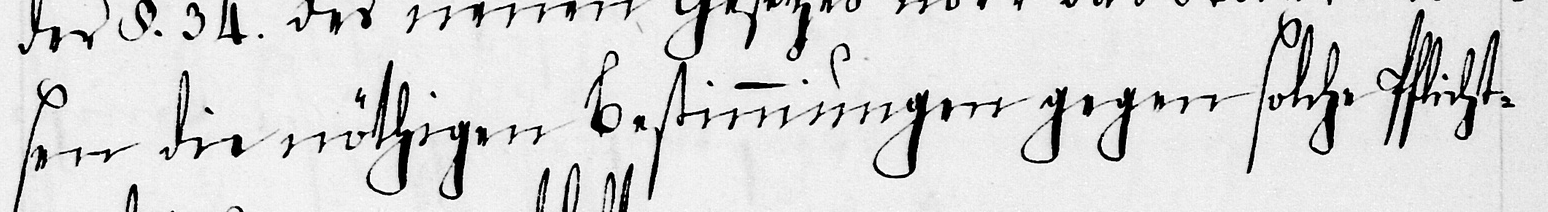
sen die nöthigen Bestimmungen gegen solche Pflich¬
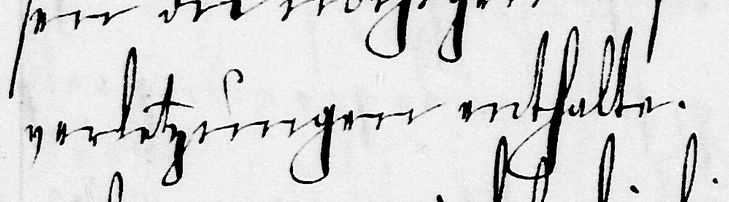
tverletzungen enthalte.
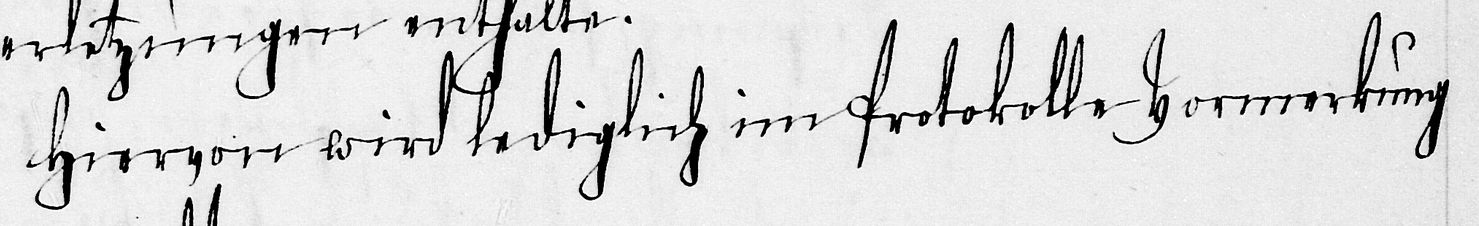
Hiervon wird lediglich im Protokolle Vormerkung
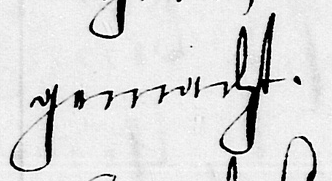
gemacht.
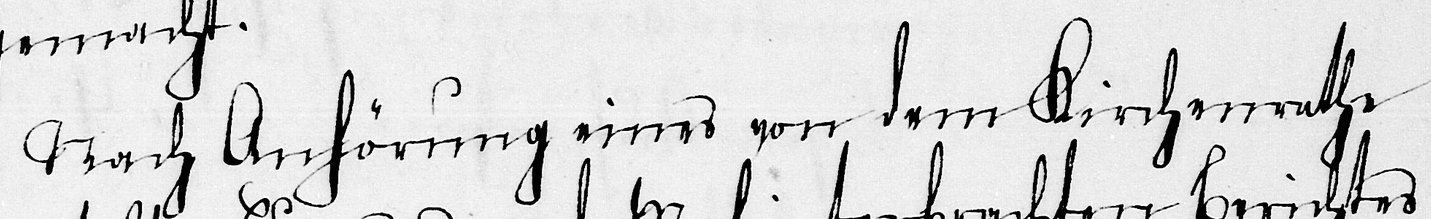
Nach Anhörung eines von dem Kirchenrathe
